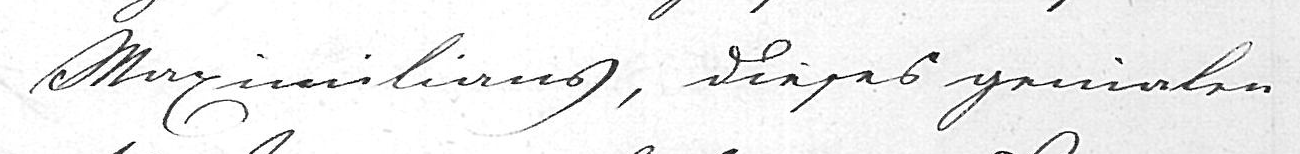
Maximilians, dieses genialen
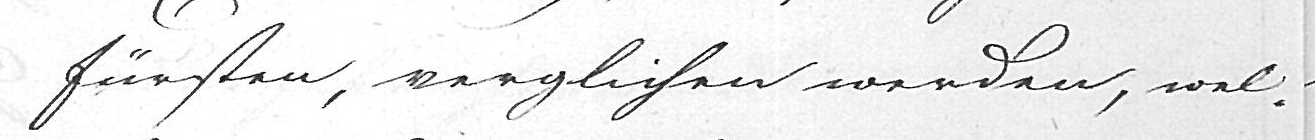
Fürsten, vergleichen werden, wel-
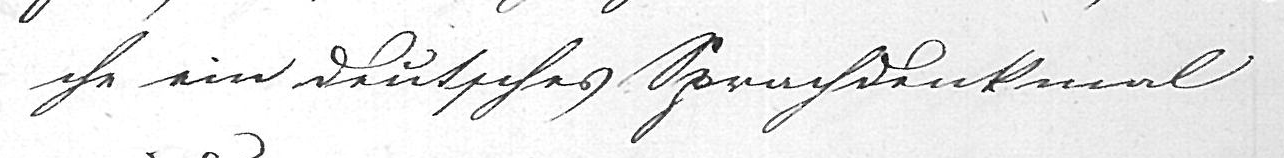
che ein deutsches Sprachdenkmal
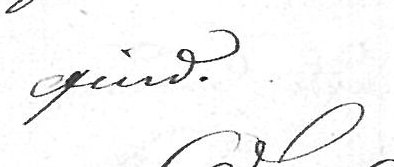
sind.
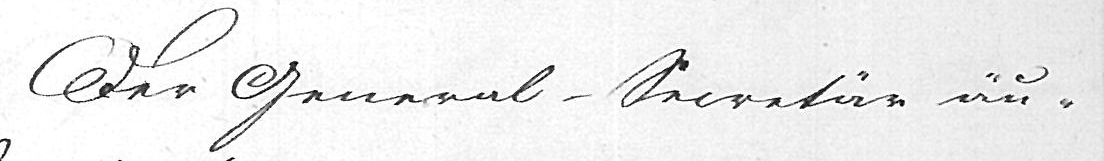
Der General-Secretär äu-
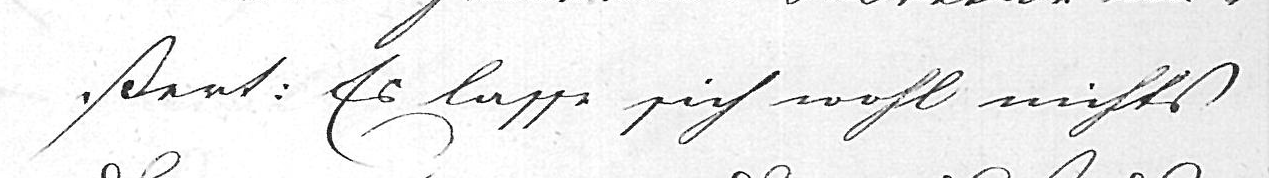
ßert: Es lasse sich wohl nichts
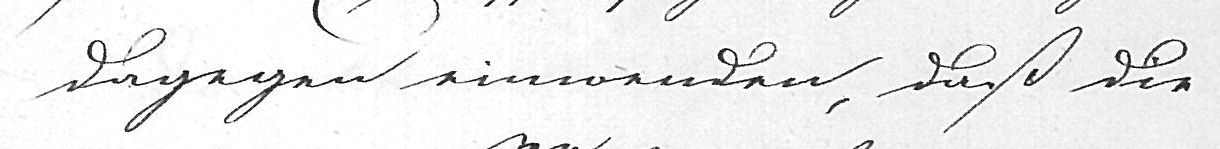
dagegen einwenden, daß die
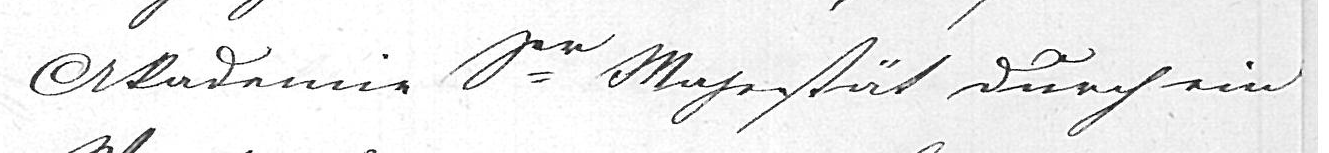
Akademie Sr Majestät durch ein
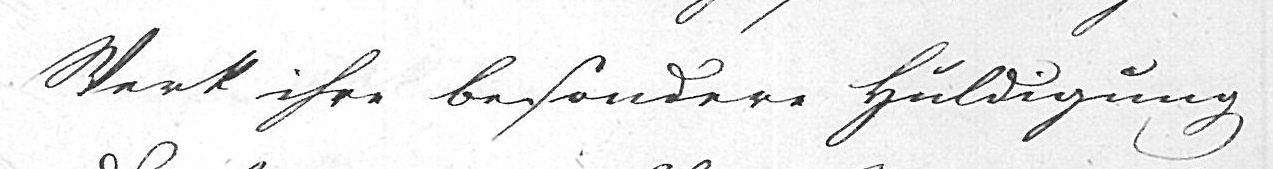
Werk ihre besondere Huldigung
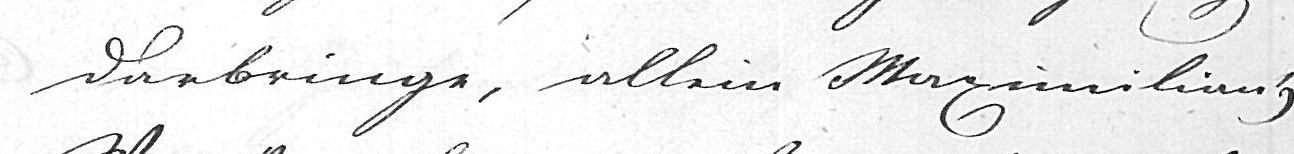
darbringe, allein Maximilian's
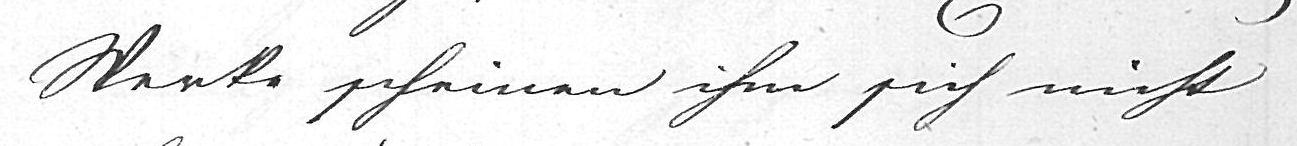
Werke scheinen ihm sich nicht
